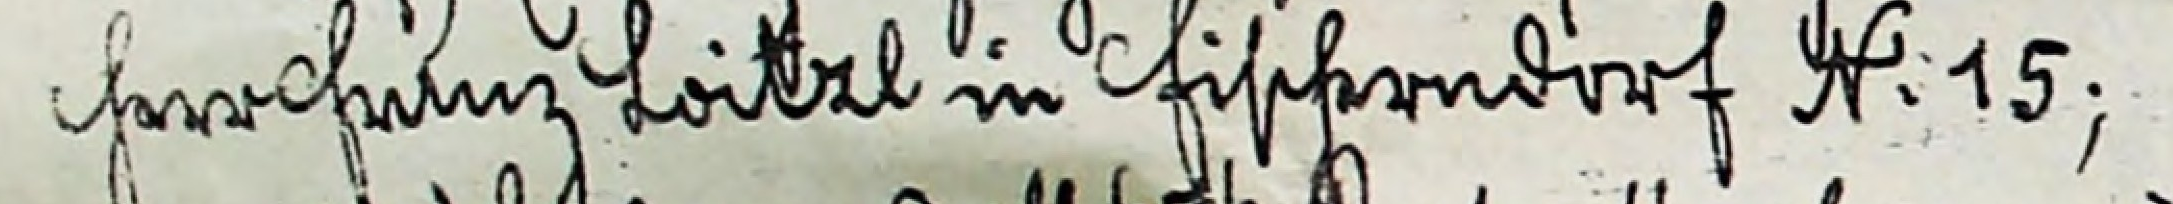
Herr Franz Loitzl in Fischerndorf № 15;
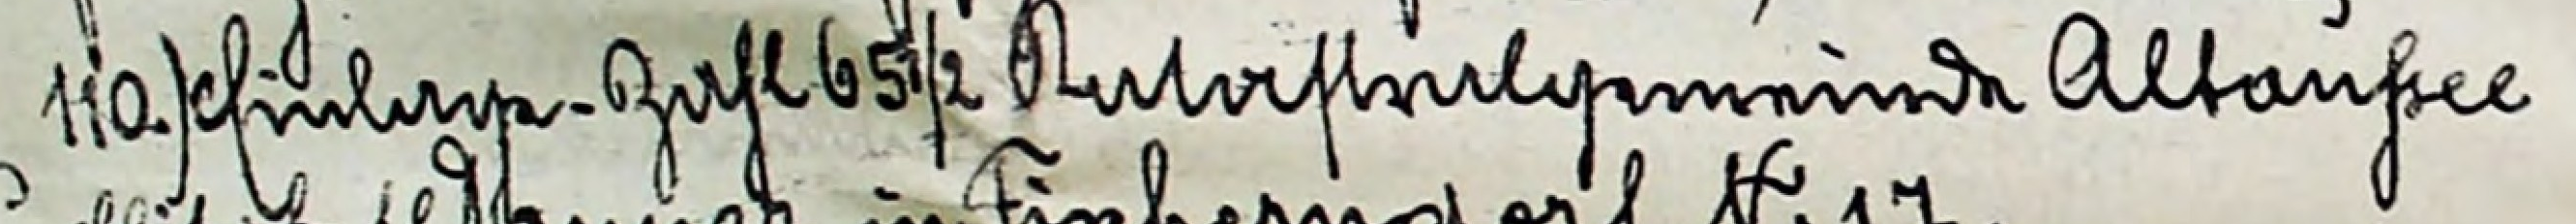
110.) Einlage - Zahl 65 1/2 Katastralgemeinde Altaussee
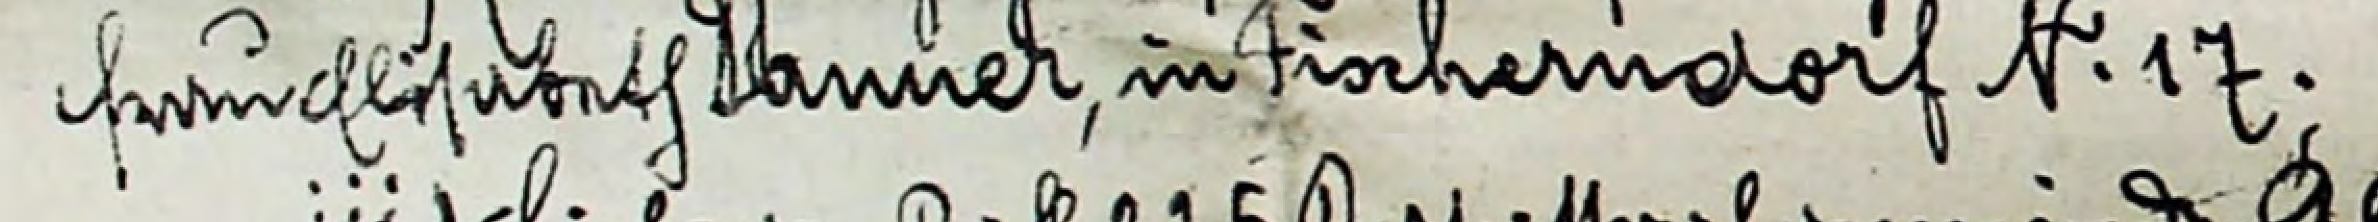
Frau Elisabeth Danner, in Fischerndorf № 17;
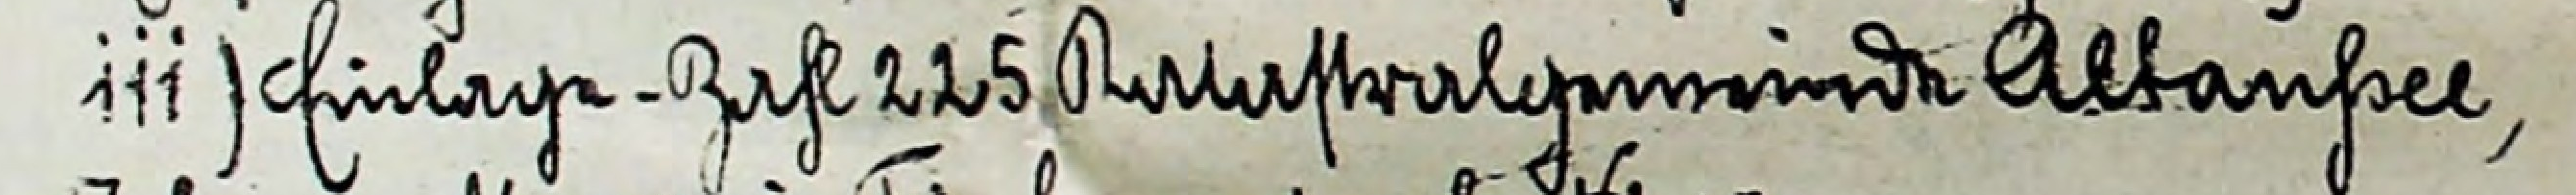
111) Einlage - Zahl 225 Katastralgemeinde Altaussee,
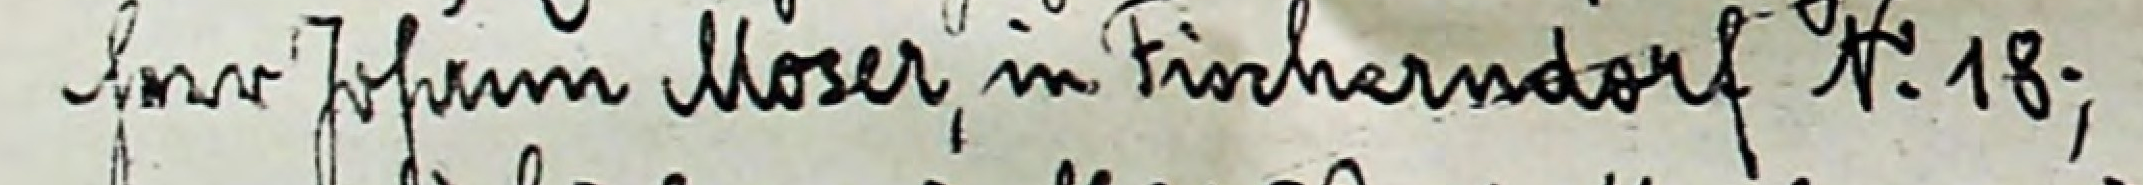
Herr Johann Moser, in Fischerndorf № 18;
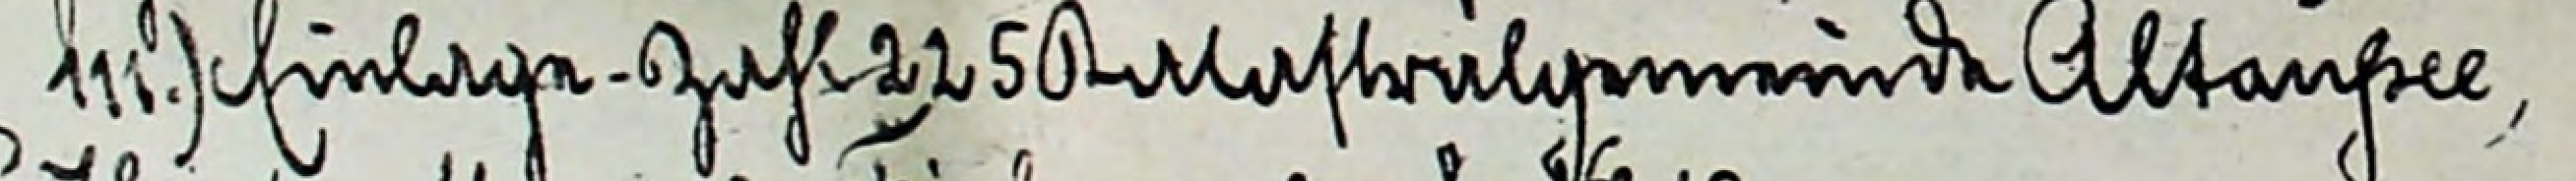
111.) Einlage - Zahl 225 Katastralgemeinde Altaussee,
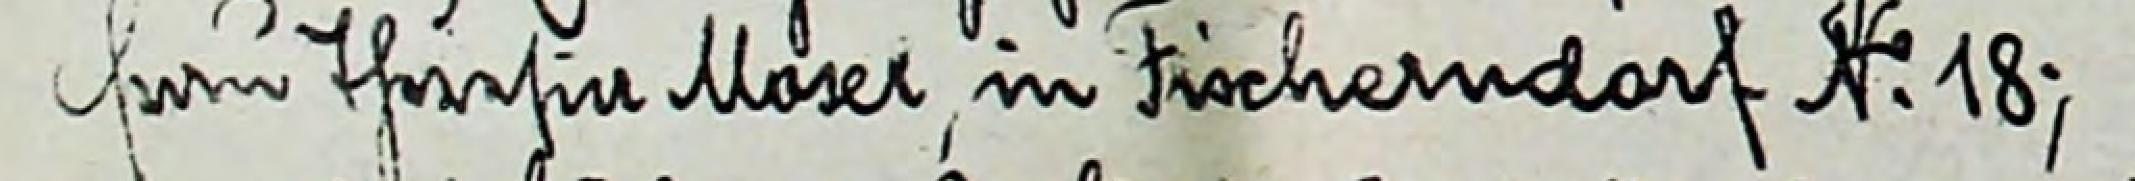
Frau Theresia Moser, in Fischerndorf № 18;
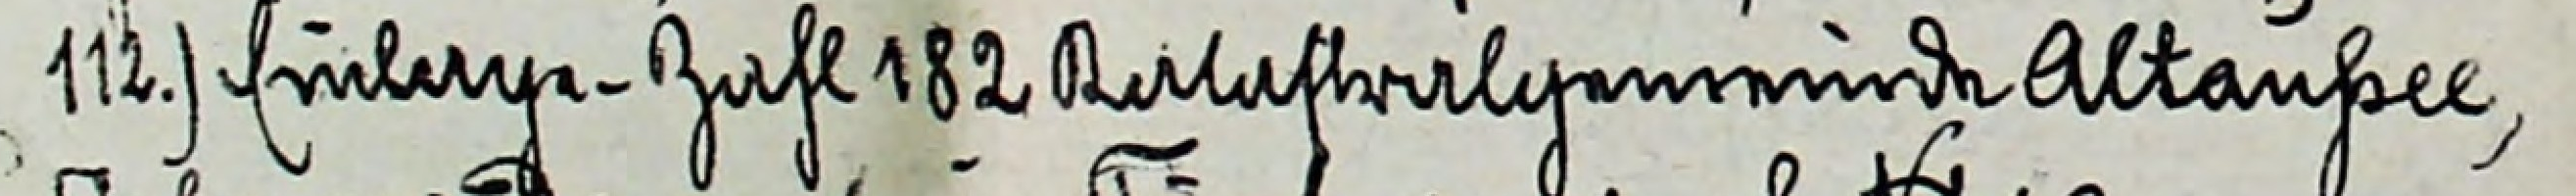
112.) Einlage - Zahl 182 Katastralgemeinde Altaussee,
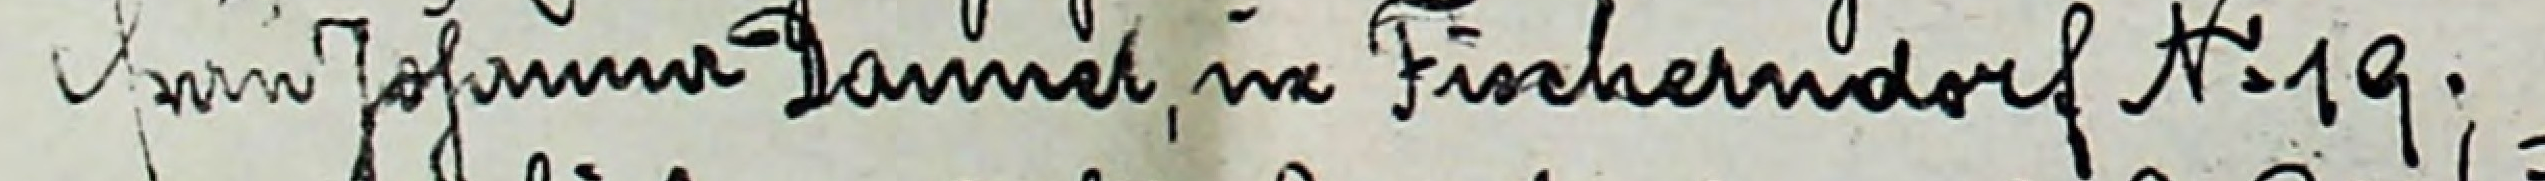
Frau Johanna Danner, in Fischerndorf № 19;
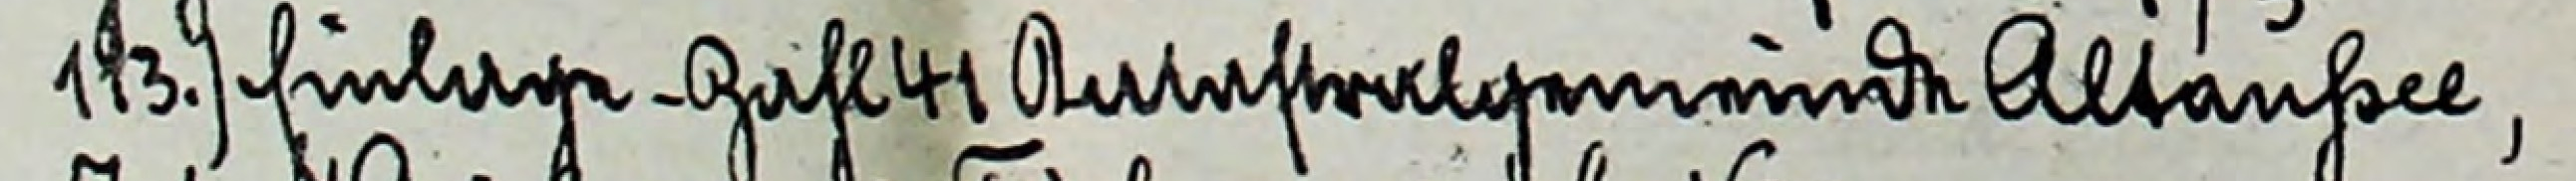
113.) Einlage - Zahl 41 Katastralgemeinde Altaussee,
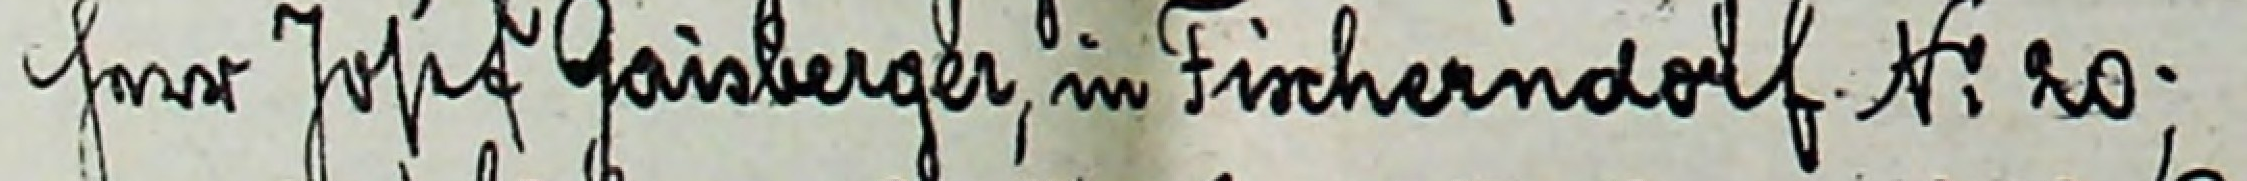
Herr Josef Gaisberger, in Fischerndorf № 20;
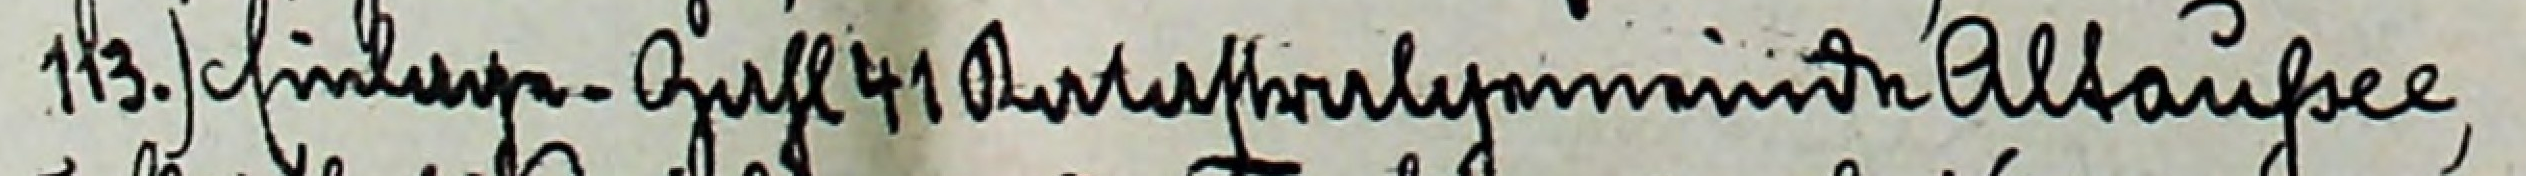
113.) Einlage - Zahl 41 Katastralgemeinde Altaussee,
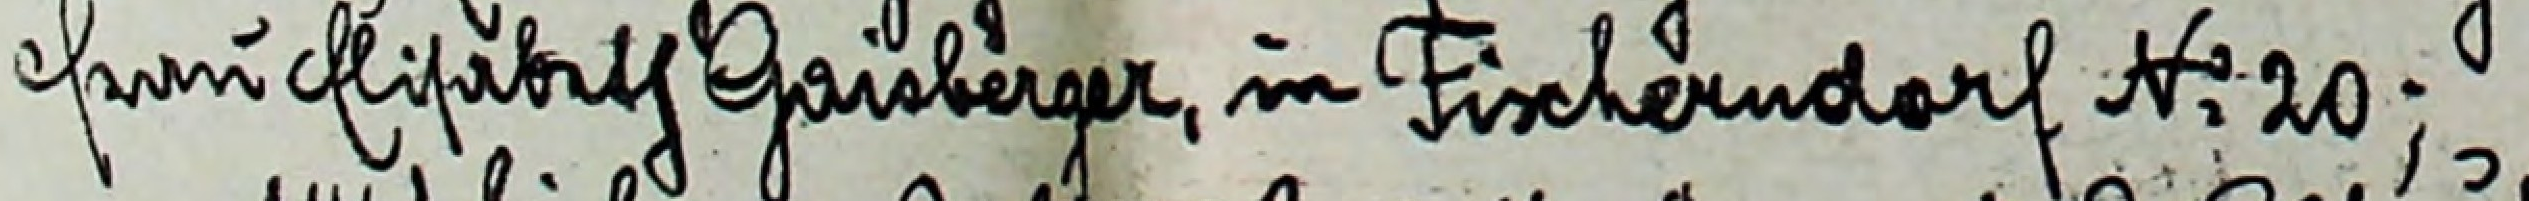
Frau Elisabeth Gaisberger, in Fischerndorf № 20;
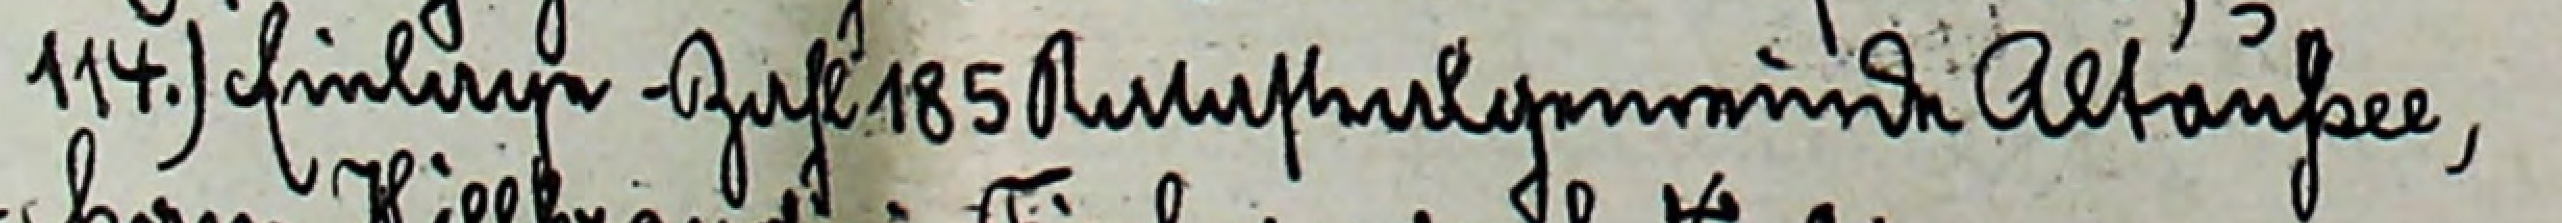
114.) Einlage - Zahl 185 Katastralgemeinde Altaussee,
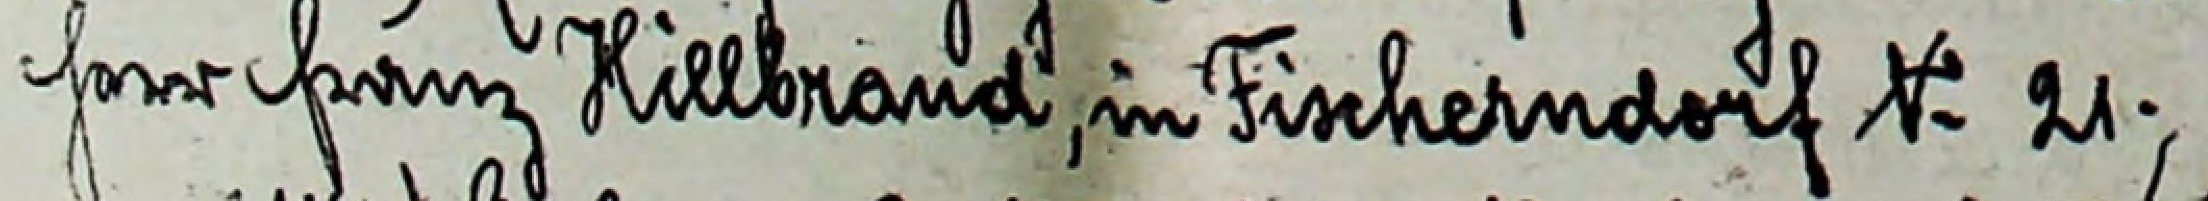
Herr Franz Hillbrand, in Fischerndorf № 21;
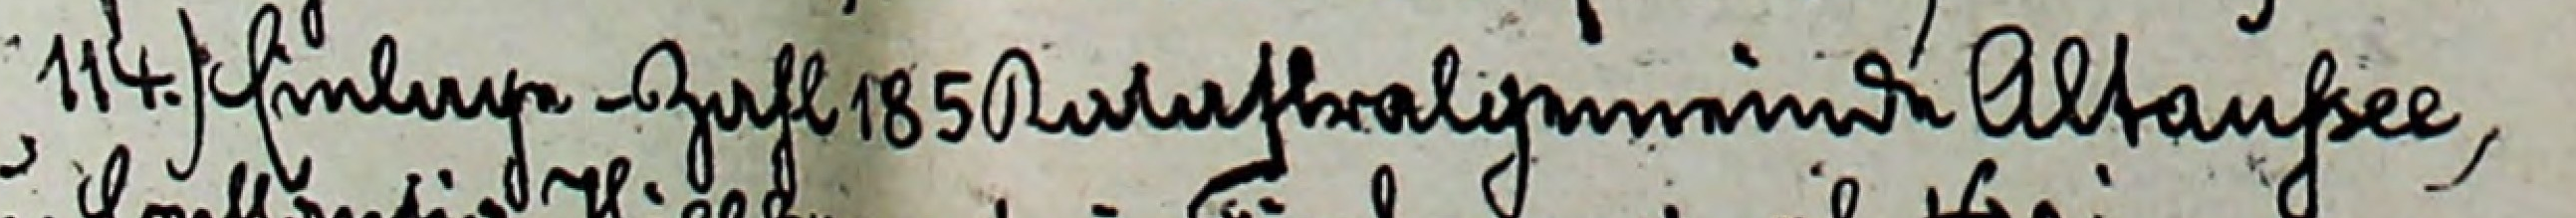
114.) Einlage - Zahl 185 Katastralgemeinde Altaussee,
